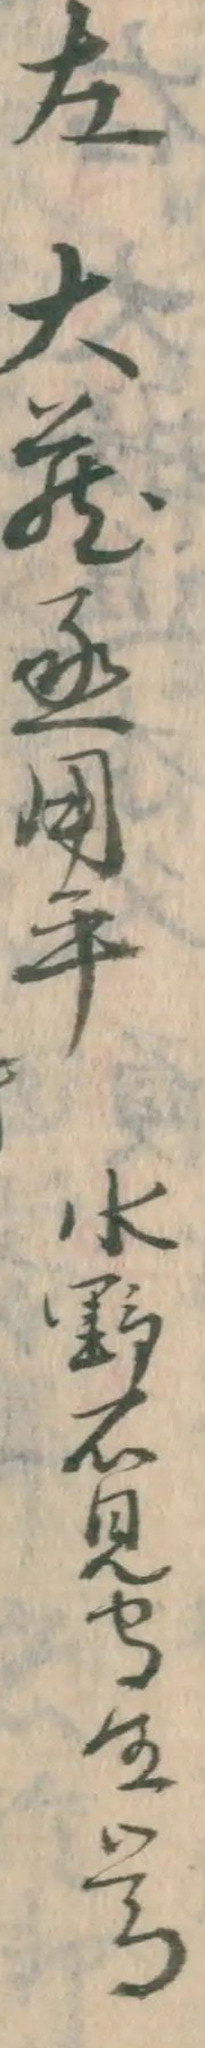左大蔵丞用平水野石見守殿御馬
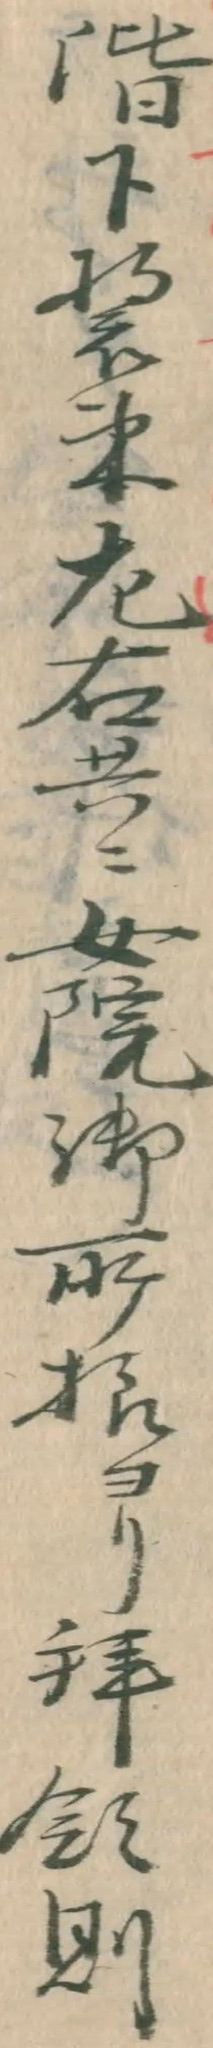階下装束左右共ニ女院御所様ヨリ拝領則
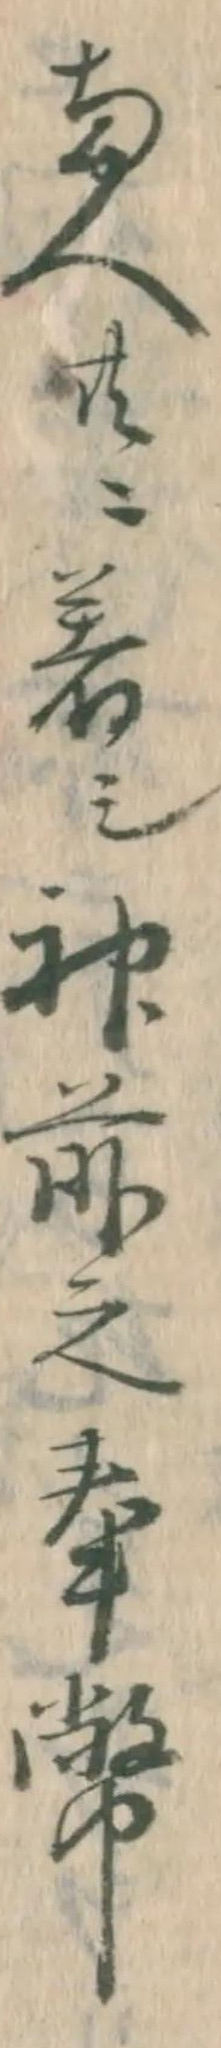両人共ニ着シ神前之奉幣
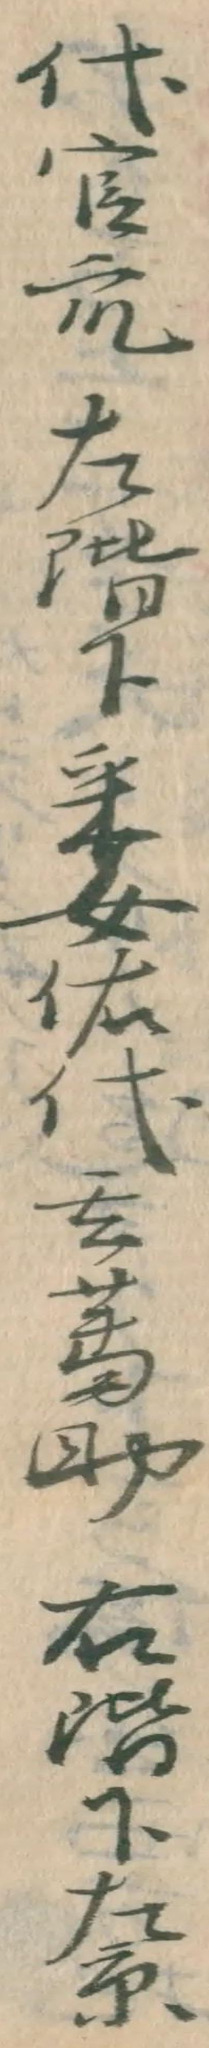代官衆左階下采女佑代玄蕃助右階下左京
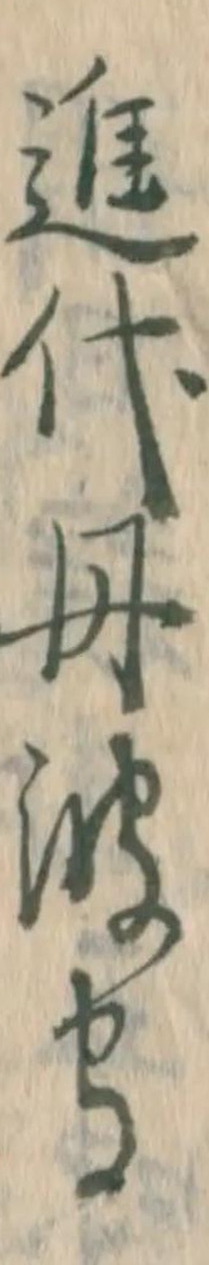進代丹波守
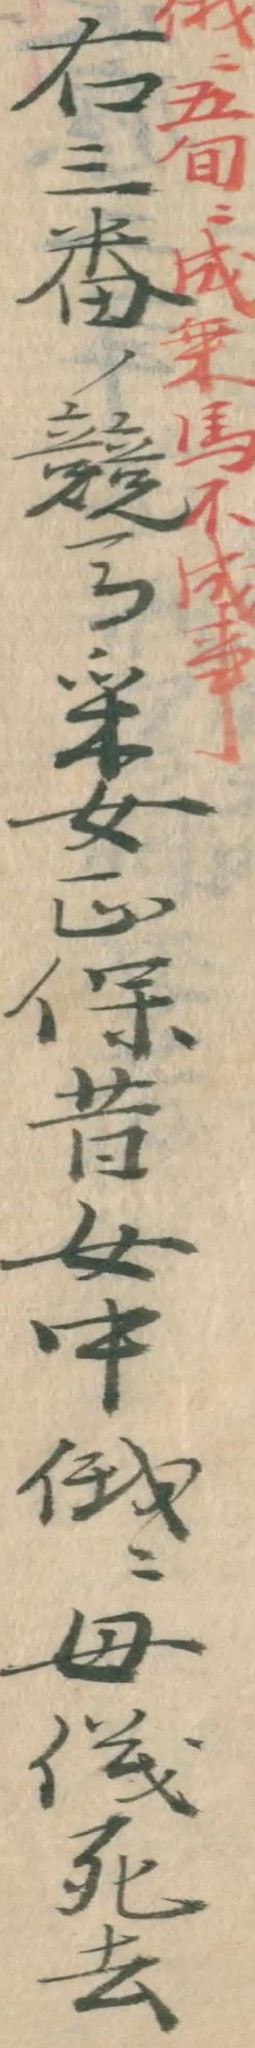右三番ノ競馬采女正保昔女中俄ニ母儀死去
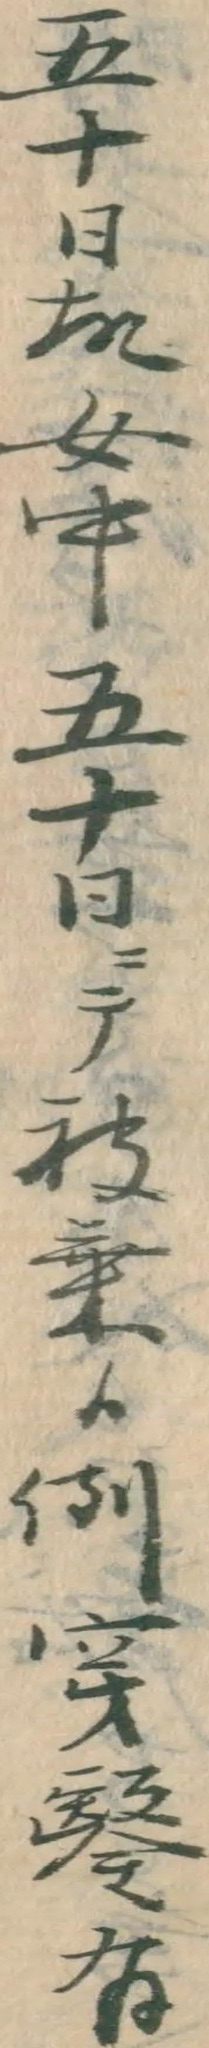五十日故女中五十日ニテ被乗候例穿鑿有
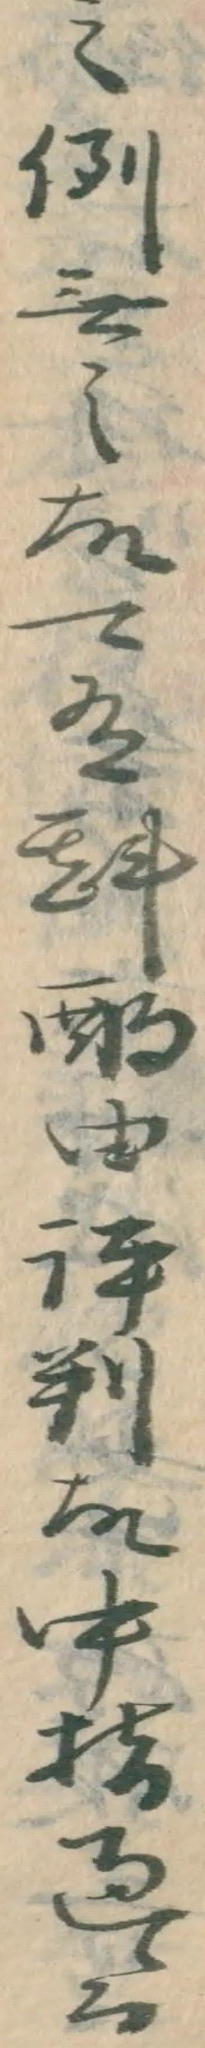之例無之故可有斟酌由評判故中指過候而

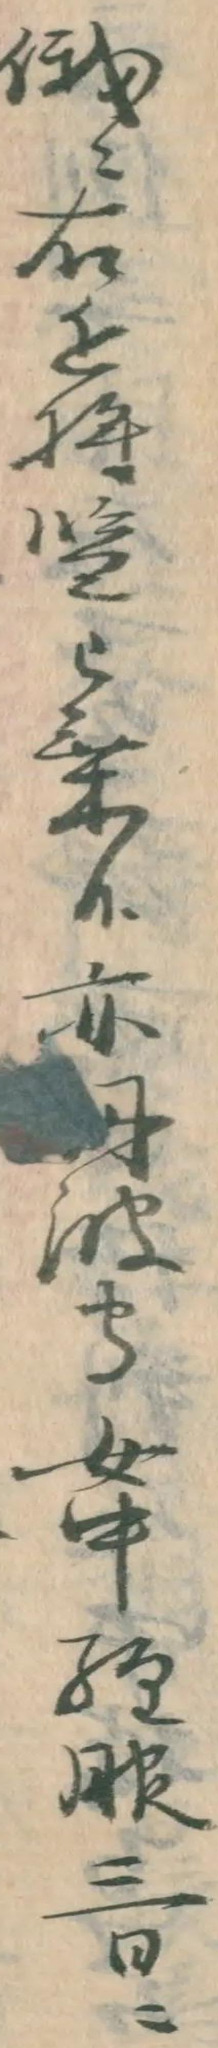俄ニ右近将監被乗候亦丹波守女中経服三日ニ
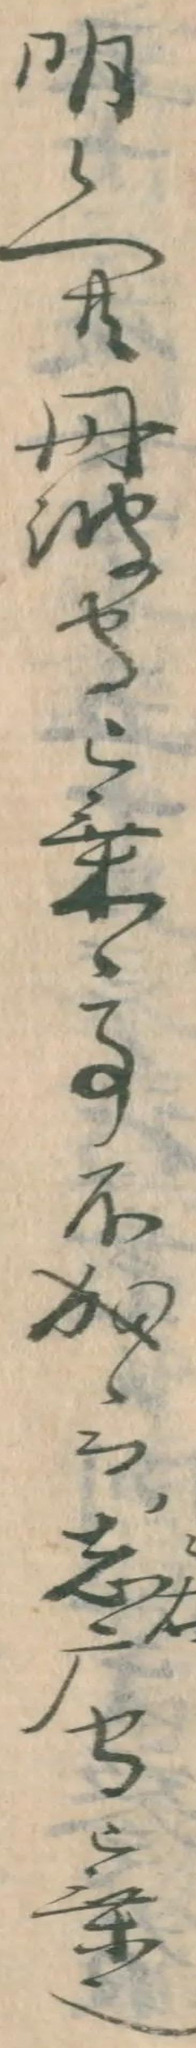明候へ共丹波守被乗候事不成候而志摩守被乗也
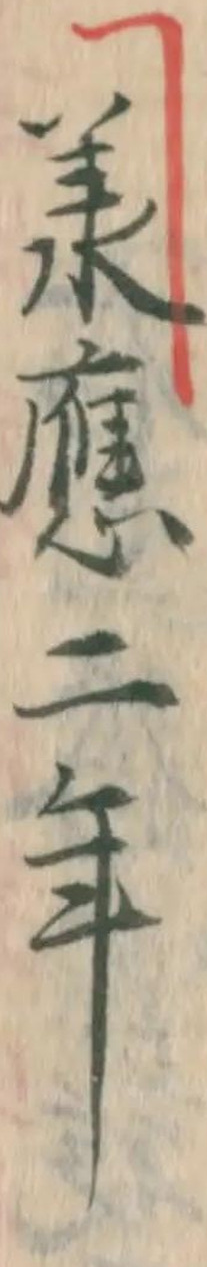承応二年
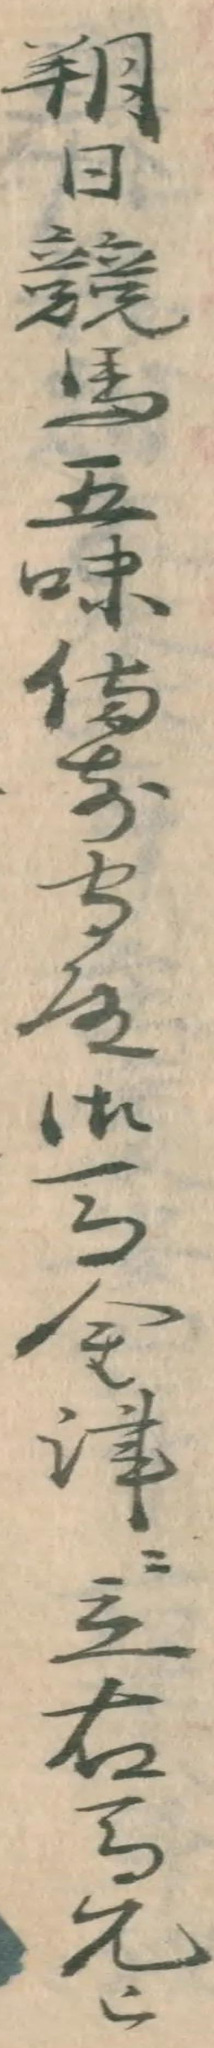朔日競馬五味備前守殿御馬金津ニ立右馬允被
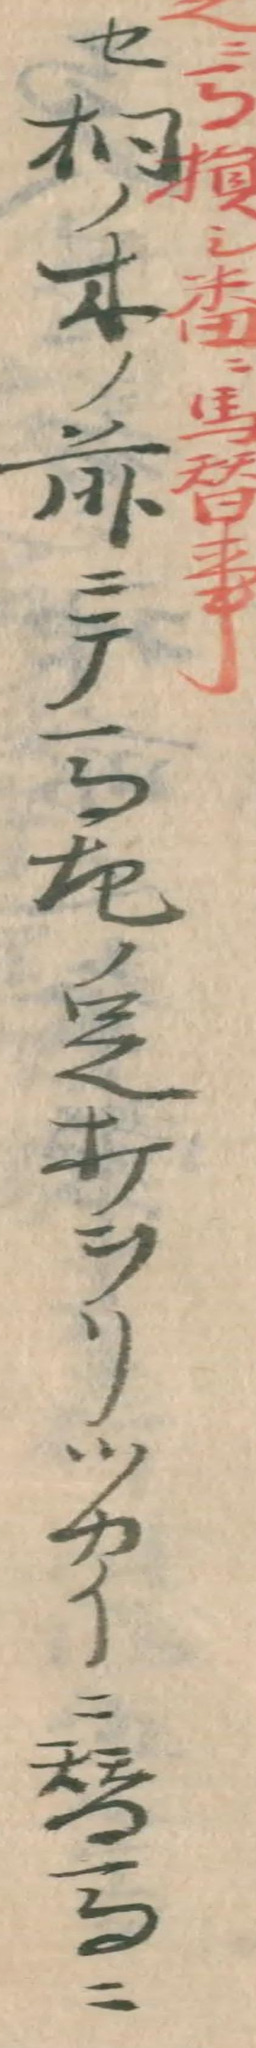セ桐ノ木ノ前ニテ馬左ノ足打ヲリツカイニ替馬ニ
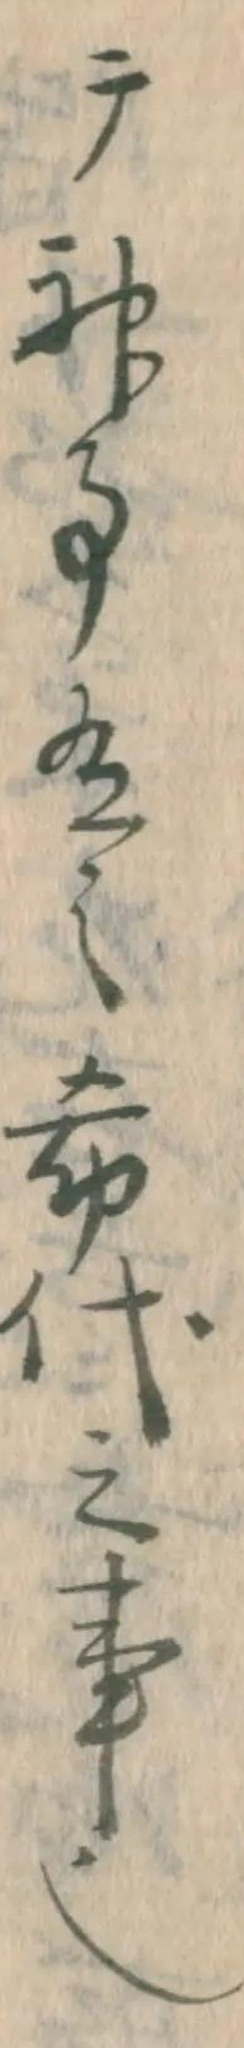テ神事有之希代之事也
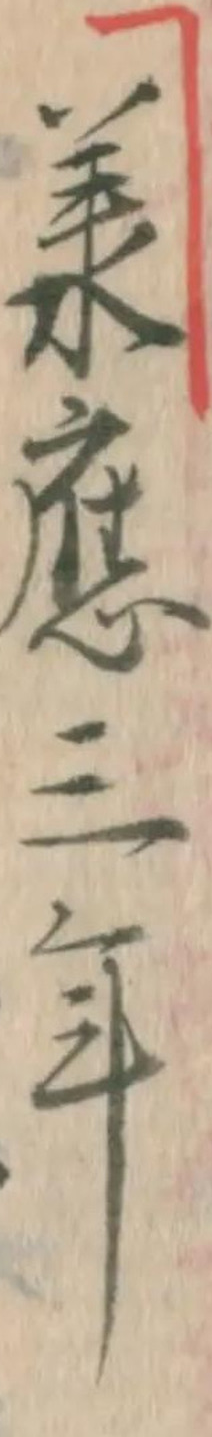承応三年
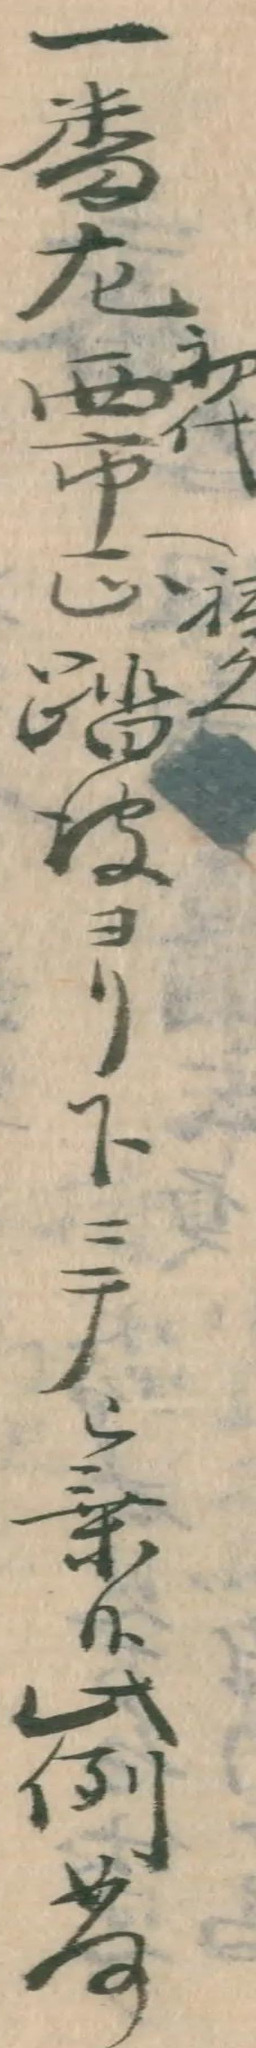一番左西市正踏波ヨリ下ニテ被乗候此例如何
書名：賀茂社記録. 第10冊
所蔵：国立国会図書館 National Diet Library, JAPAN
